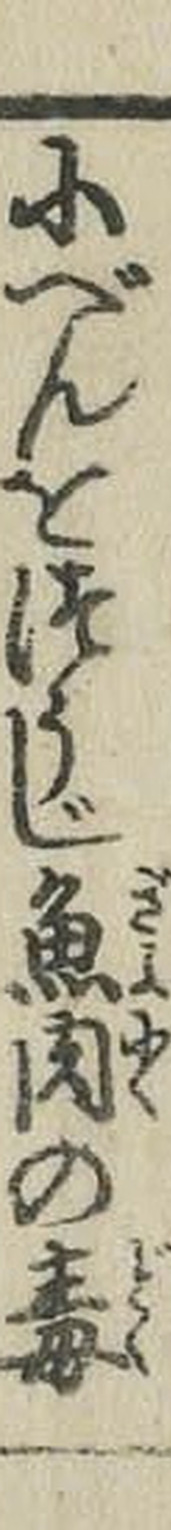小べんをつうじ魚肉の毒
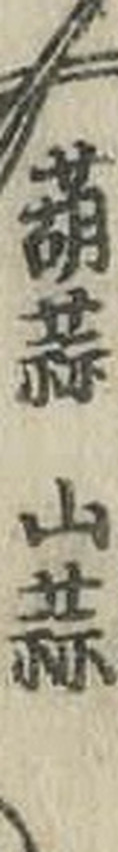葫蒜山蒜
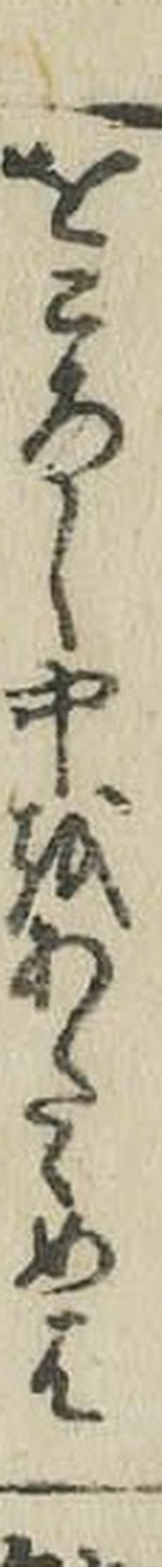をころし中をあたゝめは
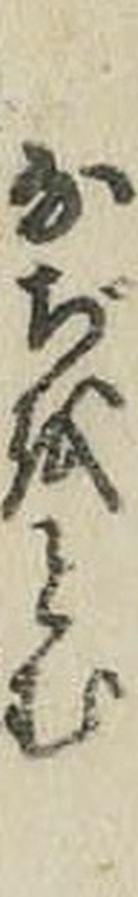なぢをとむ
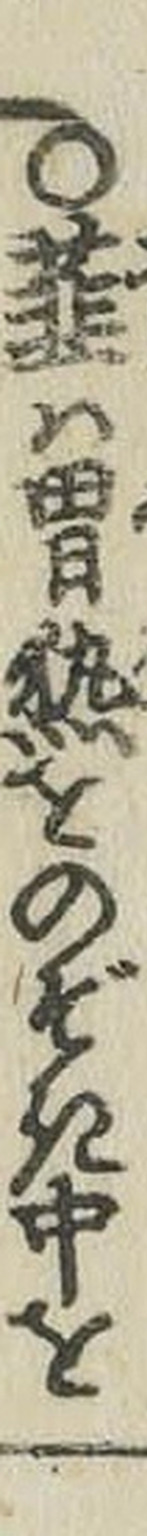○韮は胃熱をのぞき中を
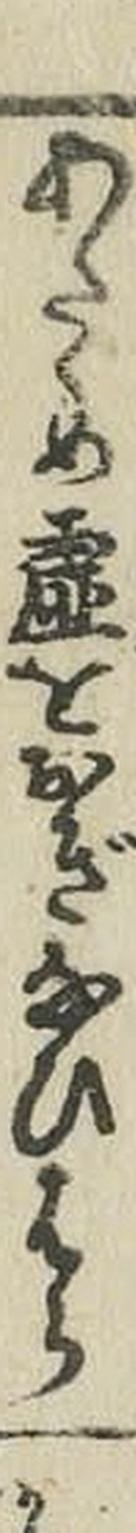あたゝめ虚をおぎなひはら
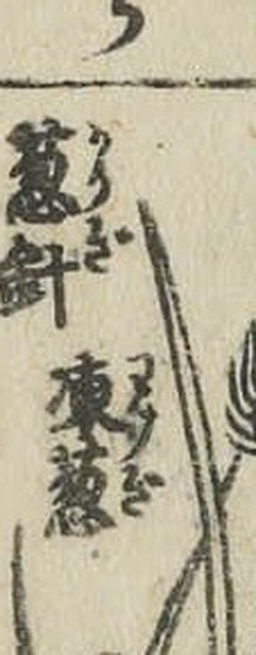葱針凍葱
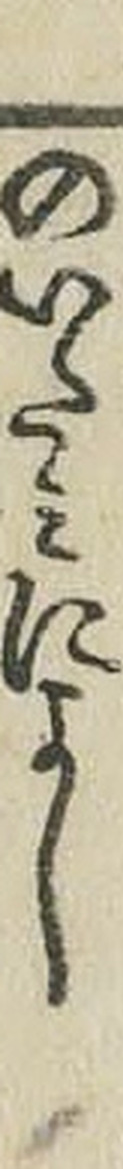のいたみによし
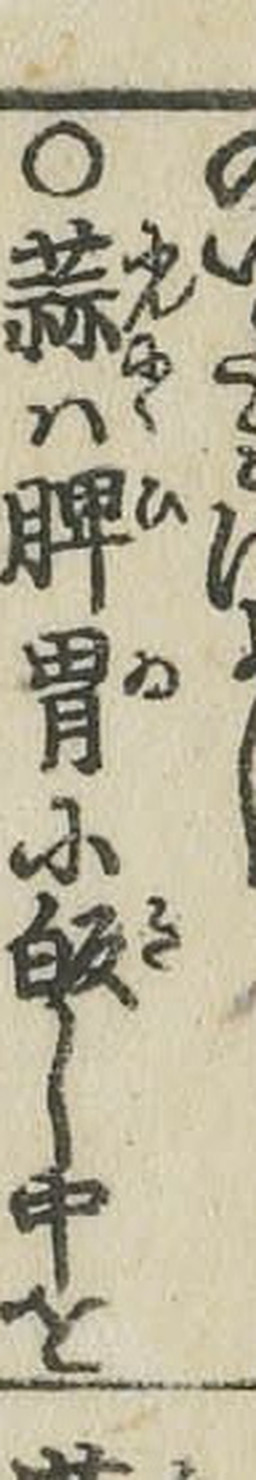○蒜は脾胃に帰し中を
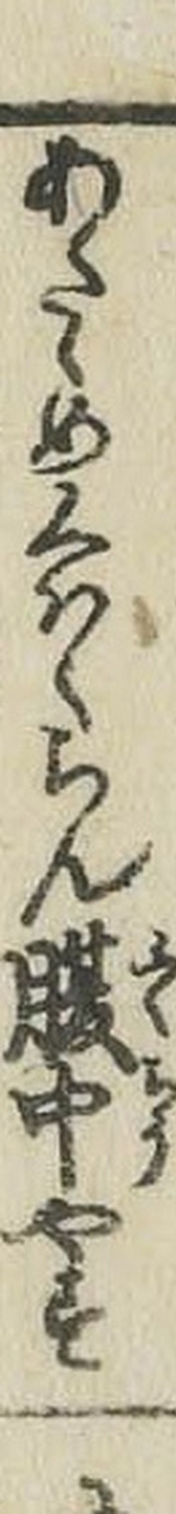あたゝめくはくらん腹中やす
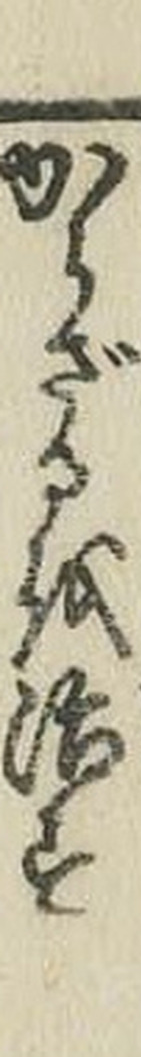からざるを治す
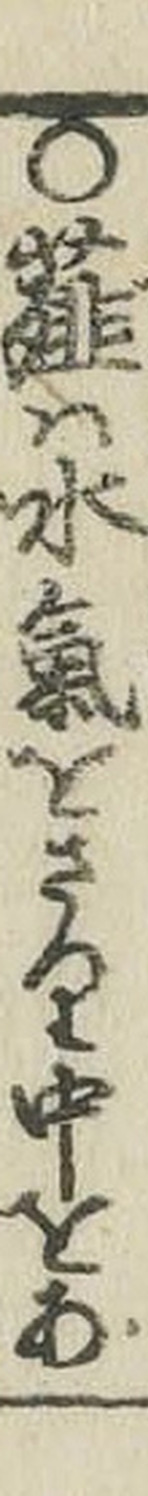○薤は水気をさり中をあ
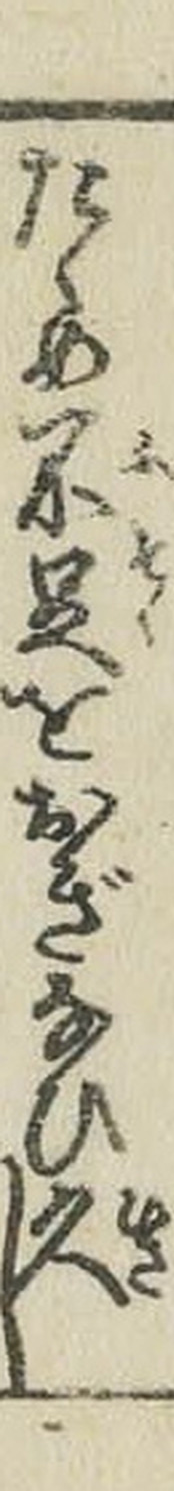たゝめ不足をおぎなひ久し
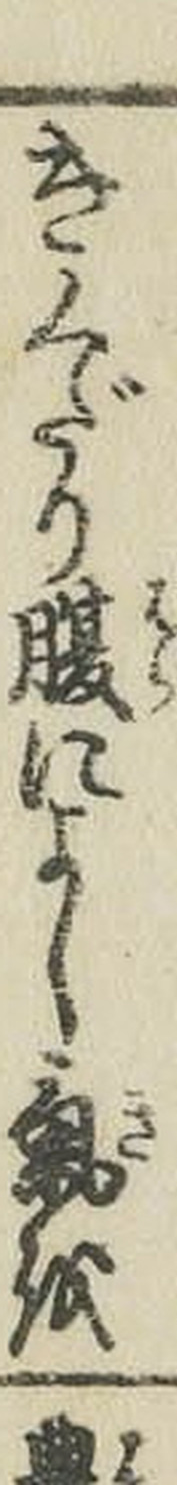きくだり腹によし気を
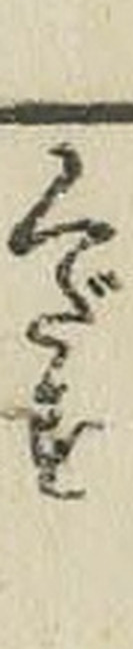くだす
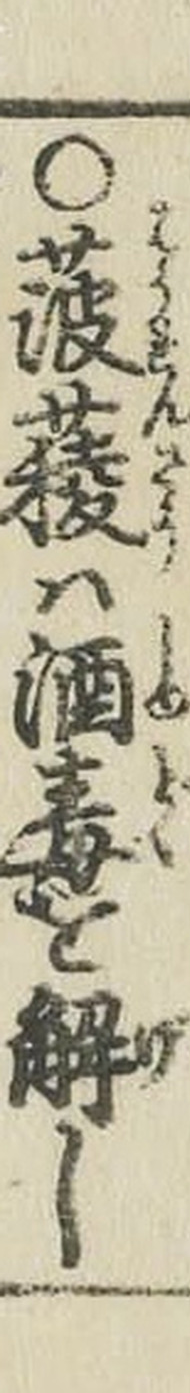○菠薐は酒毒を解し
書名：増補頭書訓蒙図彙大成 10巻 8:巻之17-19
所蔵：東京学芸大学教育コンテンツアーカイブ
